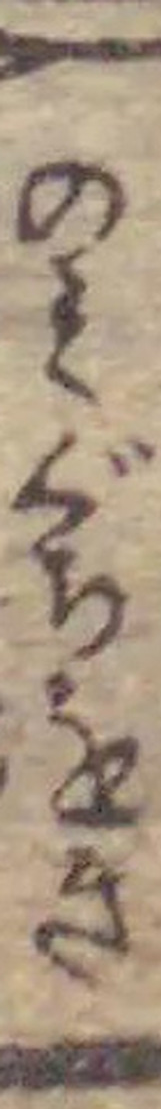のみぐちをき
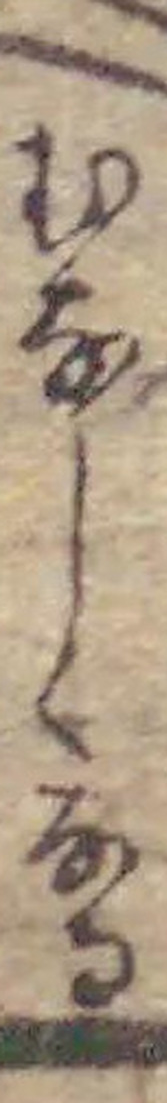むなしくなる
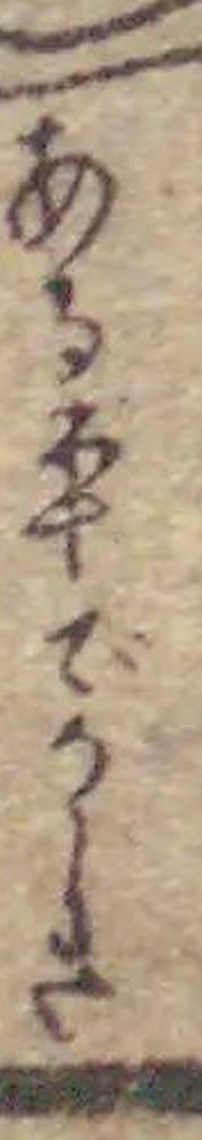ある平でかした
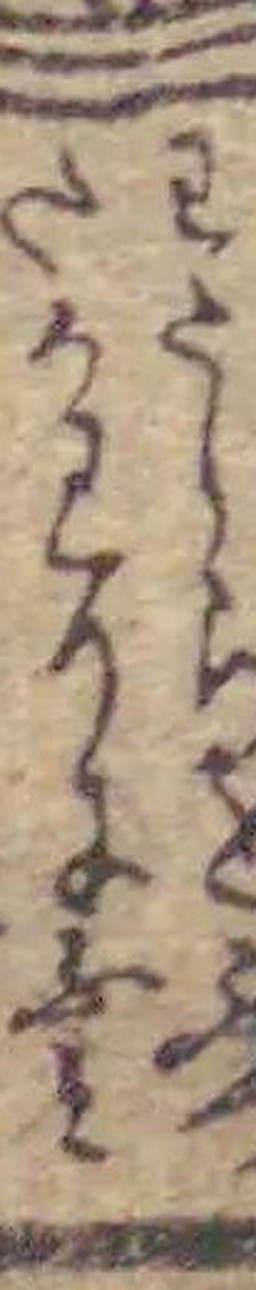たかわりにふみ
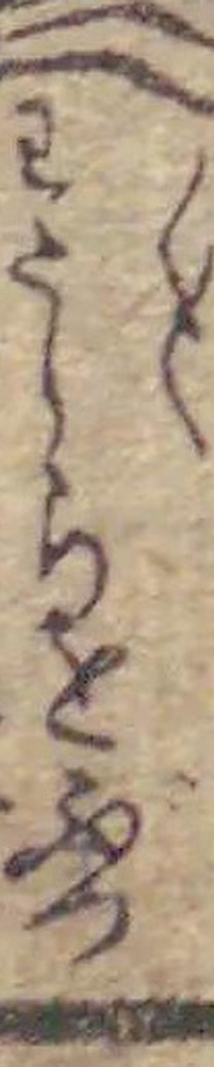わたくしらをぶつ
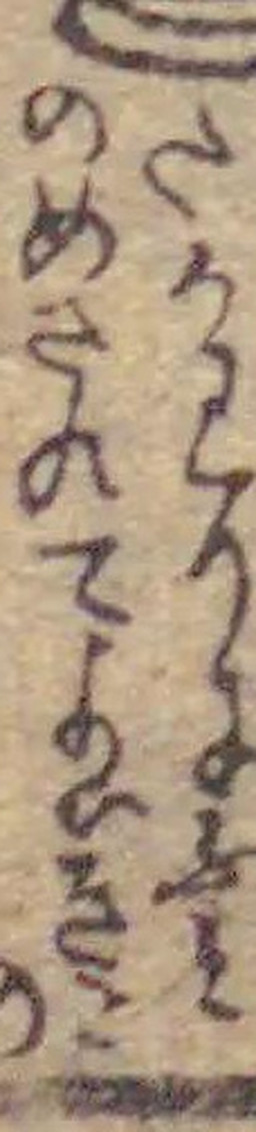のめされてよいきみ

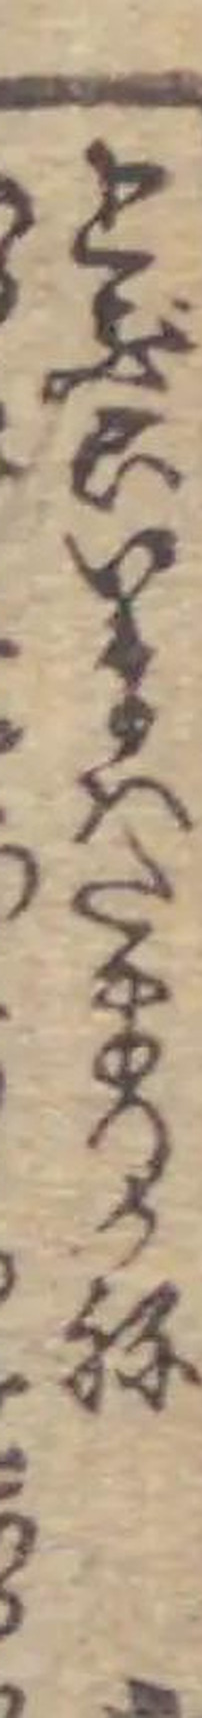とぶ六いまはたまりかね
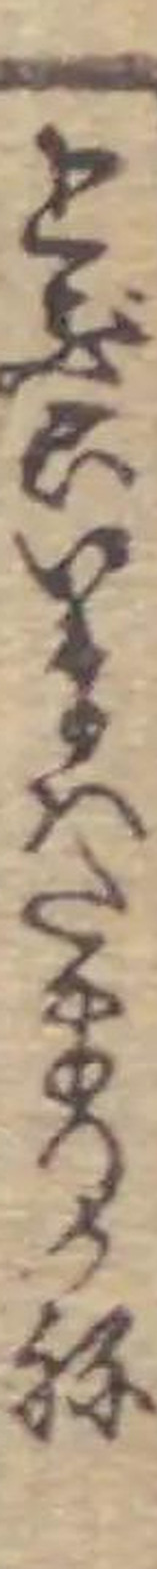とぶ六いまはたまりかね
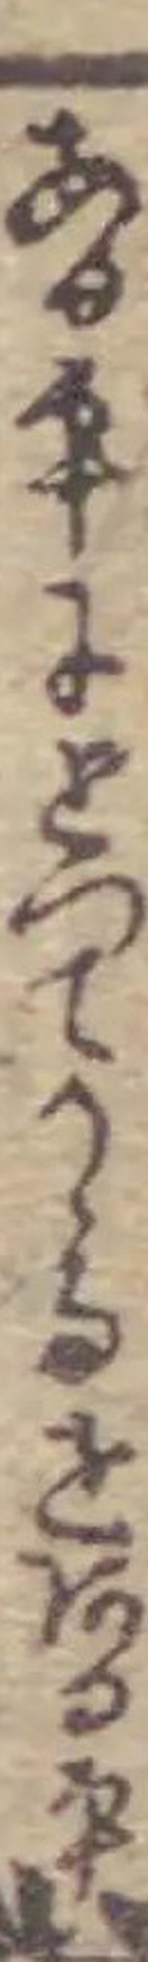ある平にとつてかゝるをある平
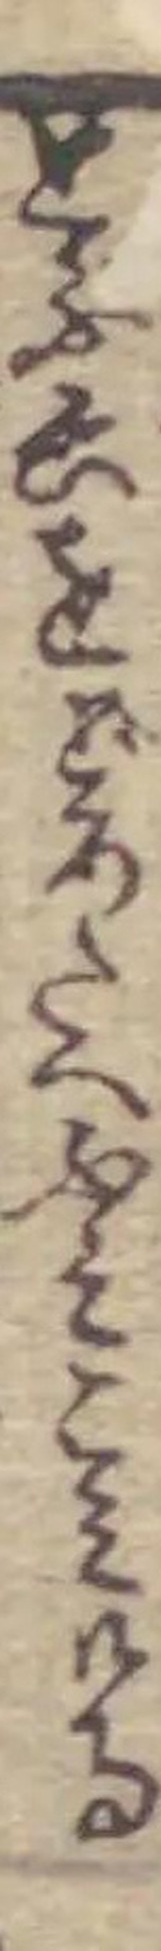とふ六をとろたへふみこみける
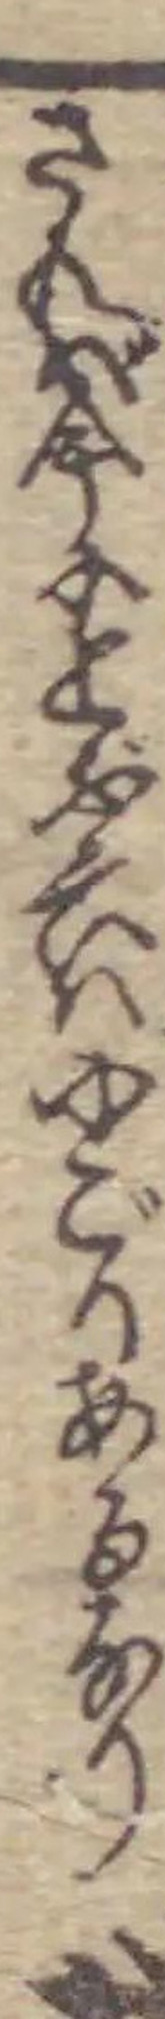されば今にとぶ六はにごりあるなり
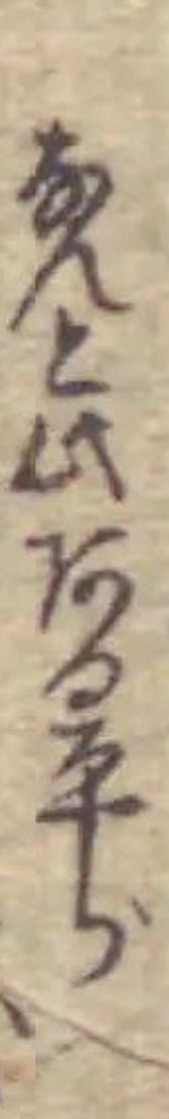なんと此ある平が
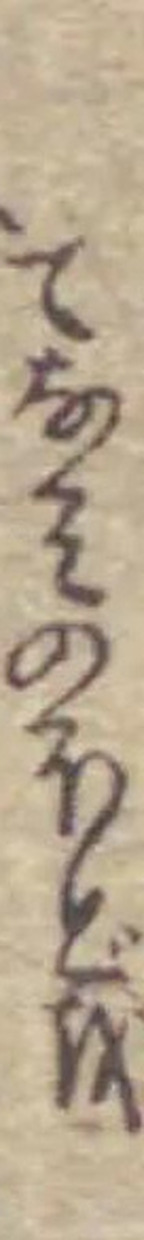てなみのほどを
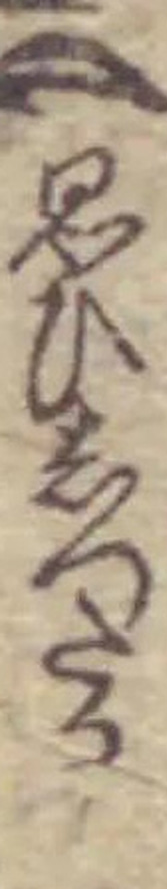思ひしつたか
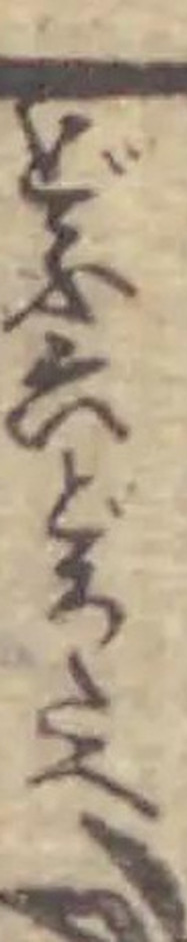どふ六どろたへ
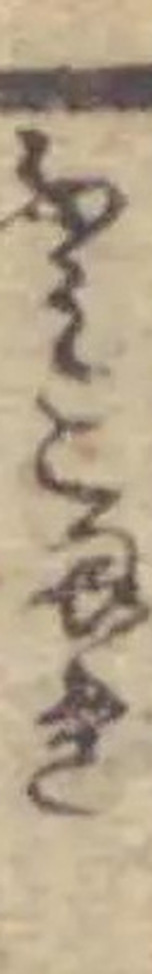ふみこまれ
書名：餅酒腹中能同志 2巻
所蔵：国立国会図書館 National Diet Library, JAPAN
